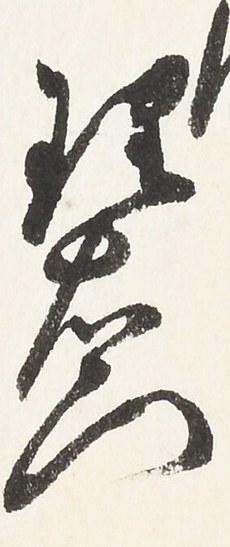理右衛門
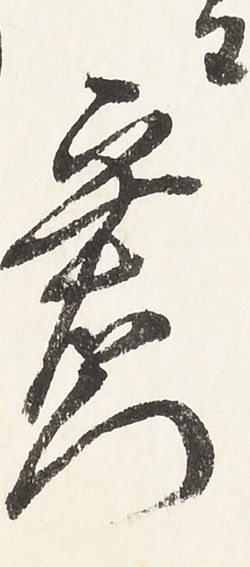平右衛門
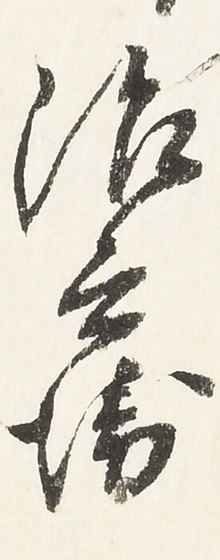治兵衛
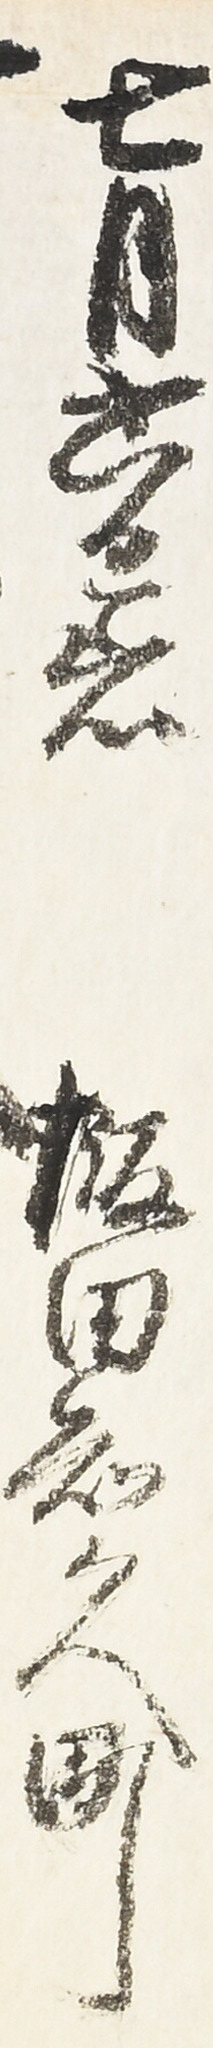七月六日着飯田知久町
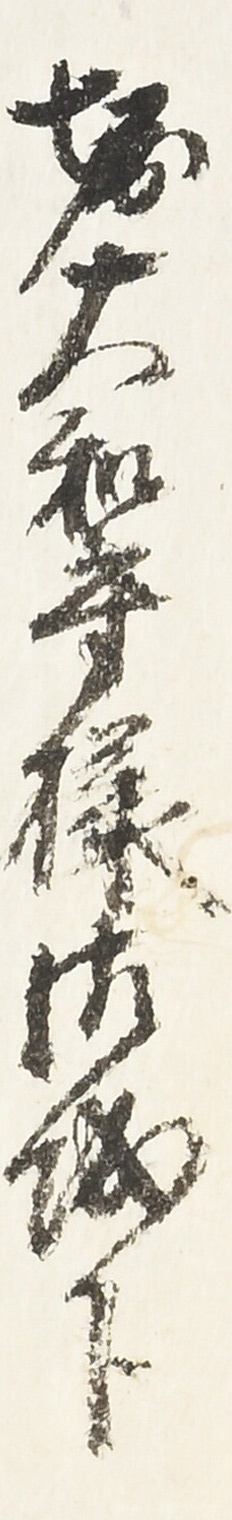堀大和守様御城下
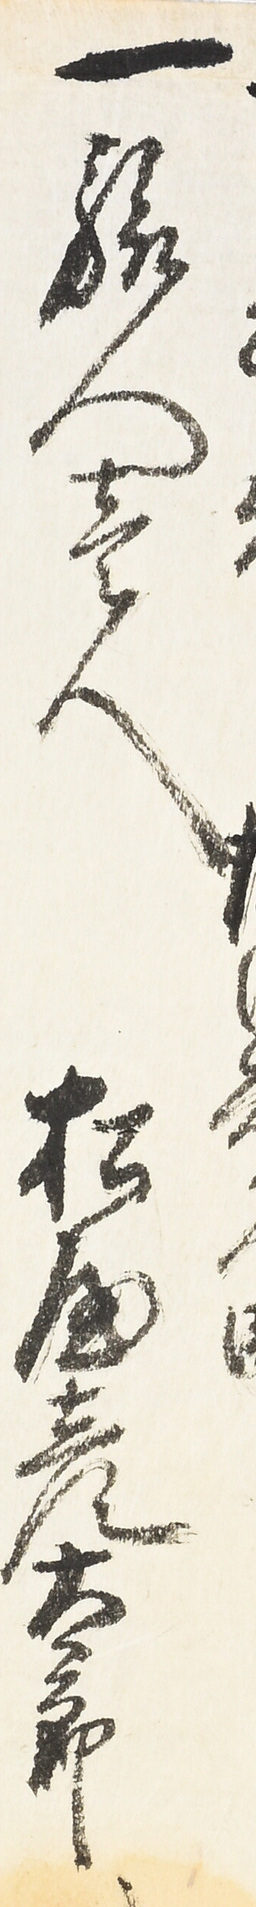一旅人壱人松屋彦太郎
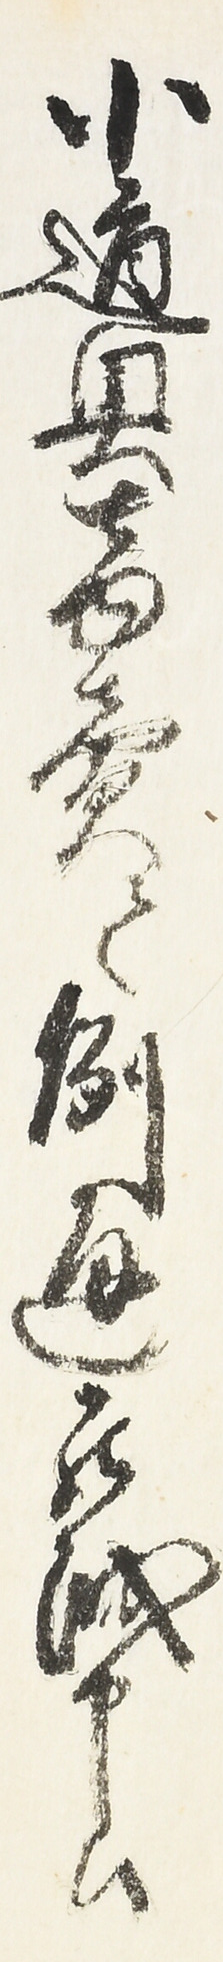小道具商売ニ而例通罷越申候
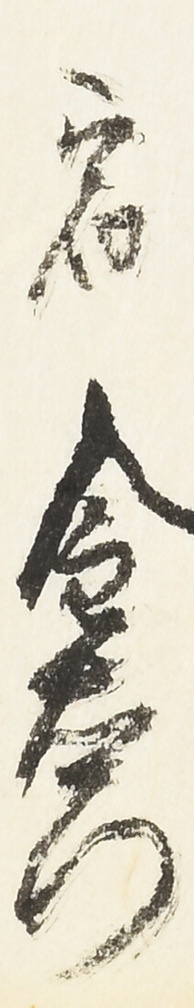宿金右衛門
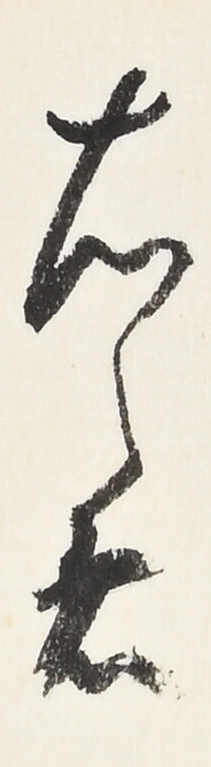右之者
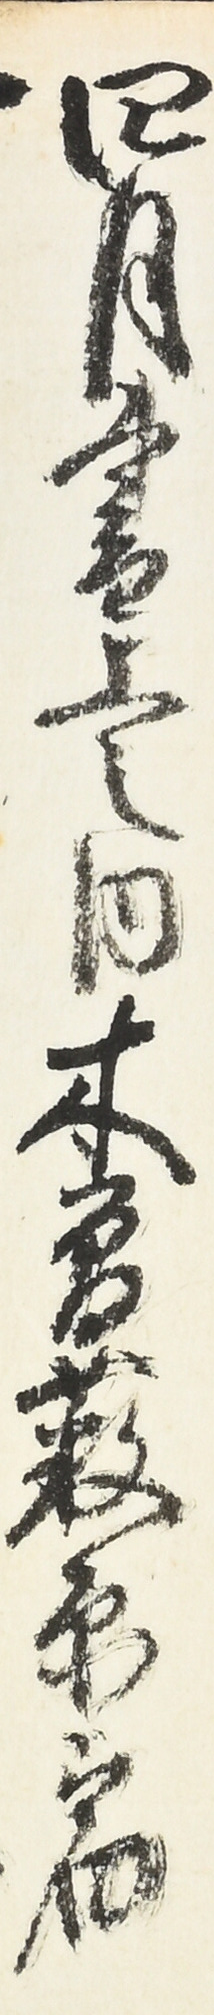四月書上之内木曾藪原宿
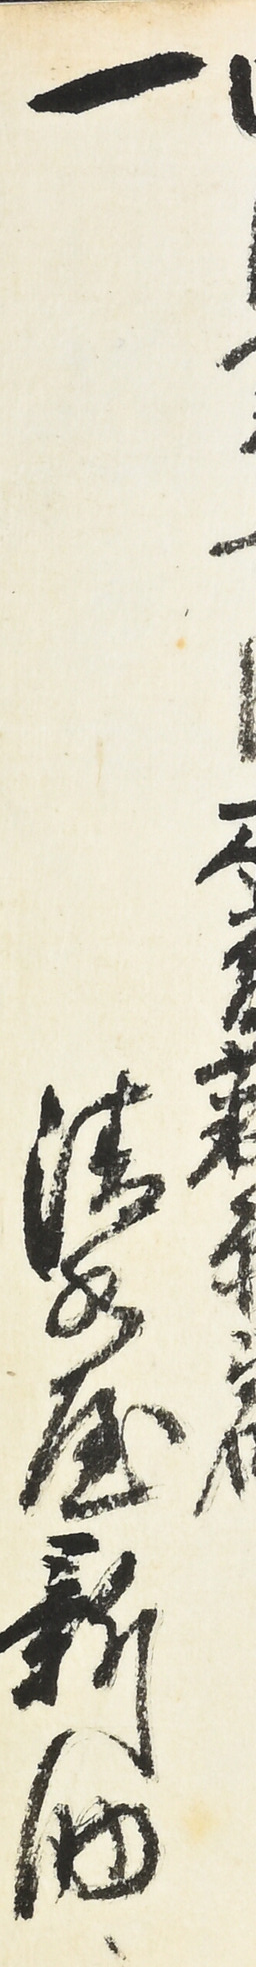一清水屋新助
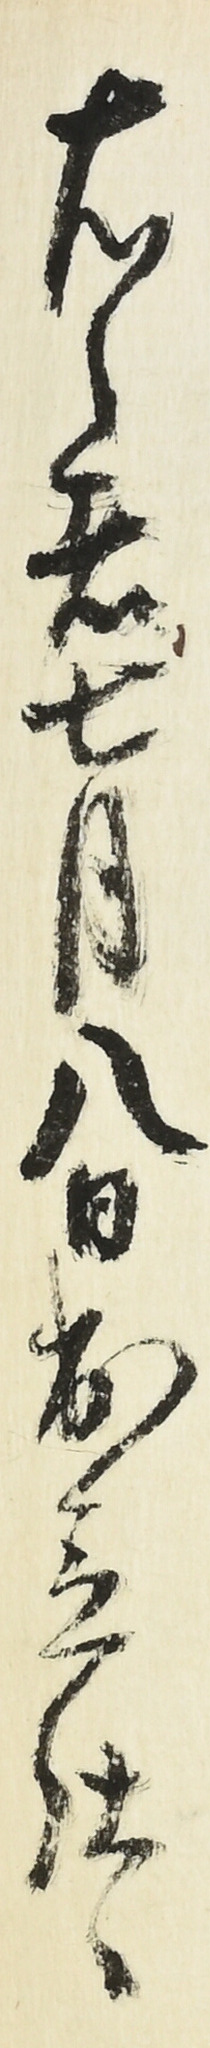右之者七月八日出立仕候

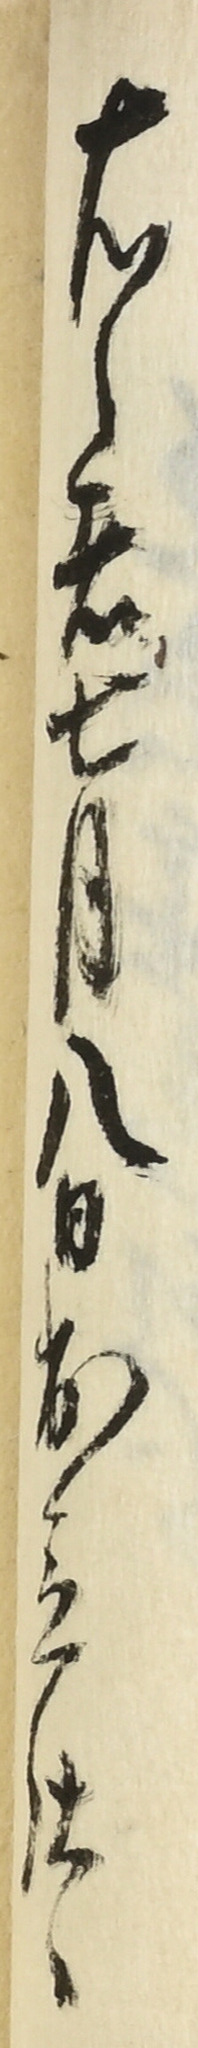右之者同十三日出立仕候
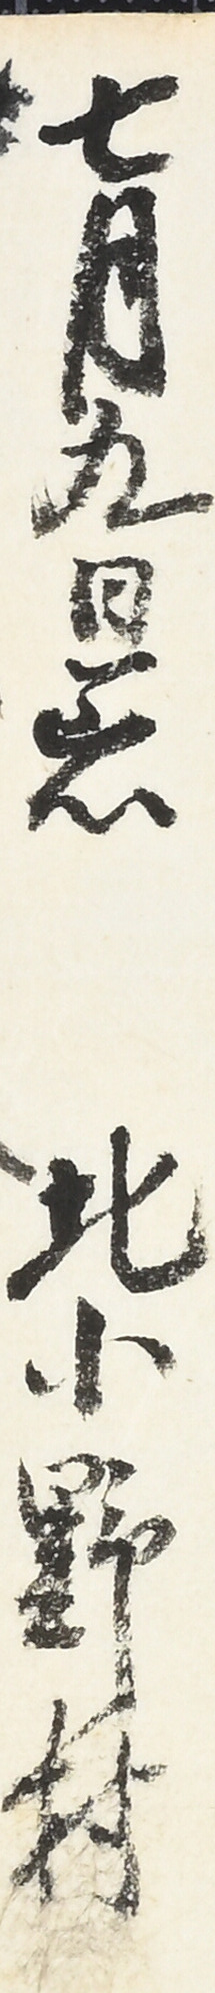七月九日着北小野村
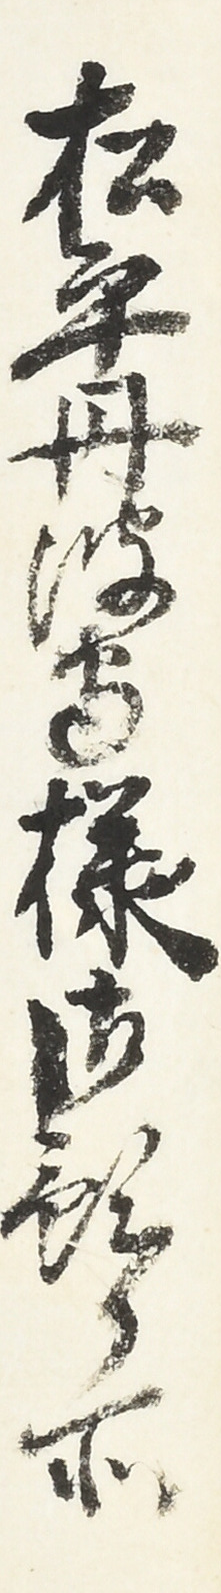松平丹波守様御預り所
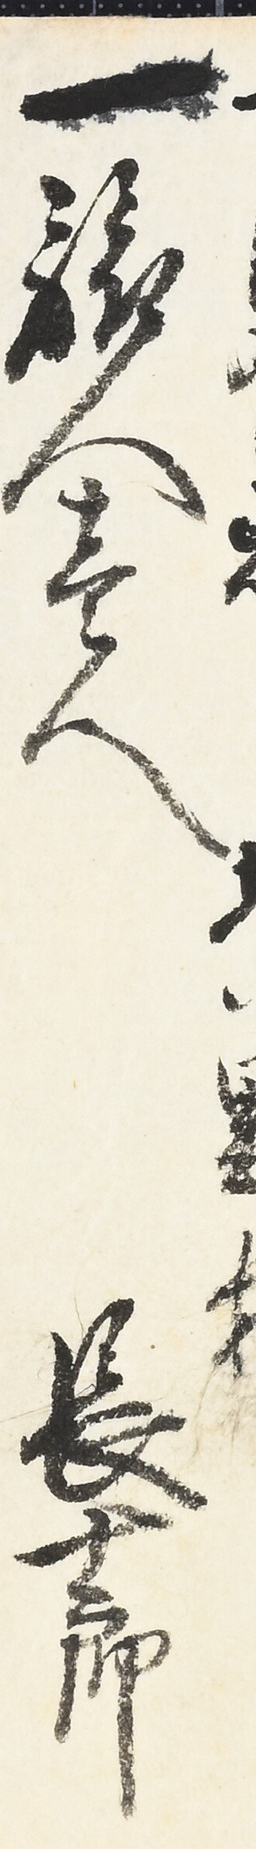一旅人壱人長十郎
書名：町中旅人泊控帳
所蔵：伊那市立高遠町図書館・合同会社AMANE
